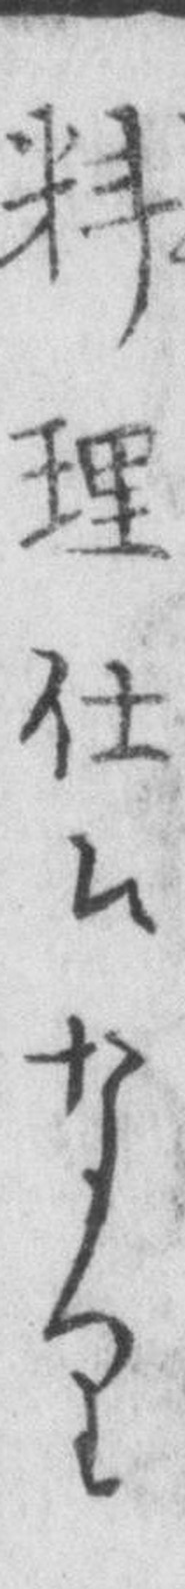料理仕候なり
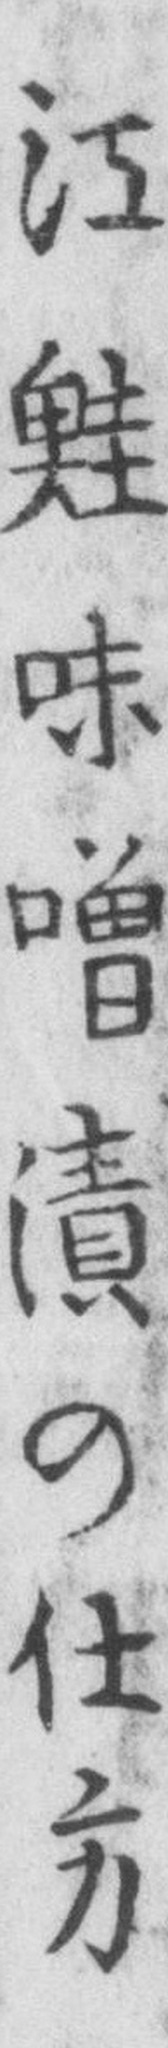江鮭味噌漬の仕方
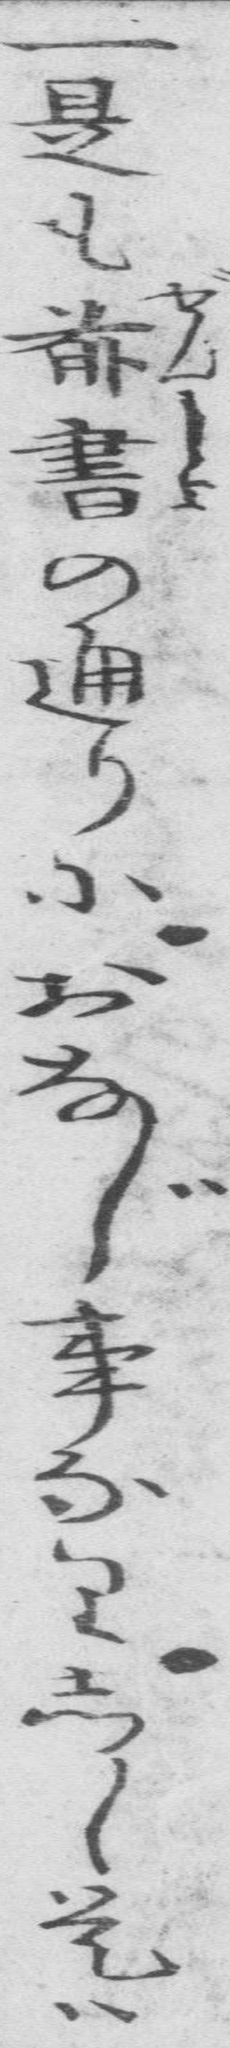一是も前書の通りに。おなじ事なり。しかし是は
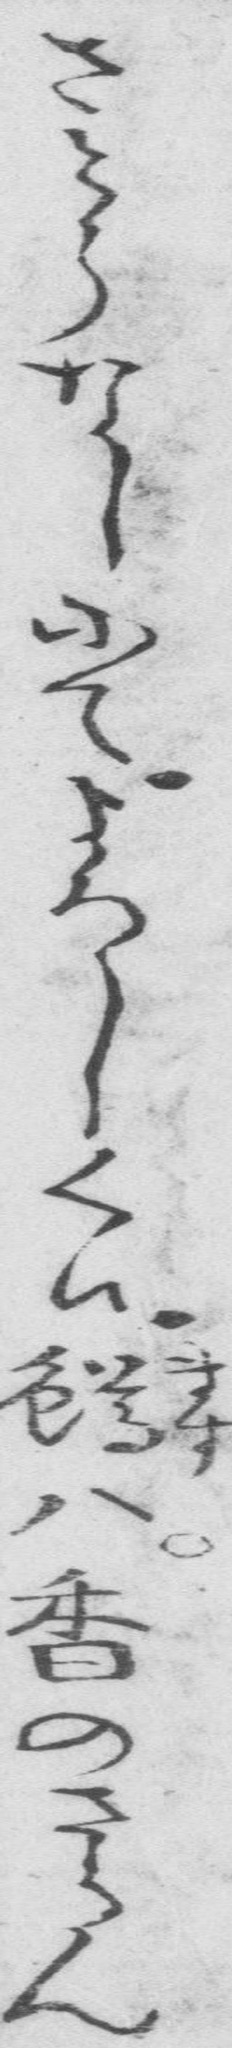さとうなしにて。よろしく候。鱒は。香のさらん
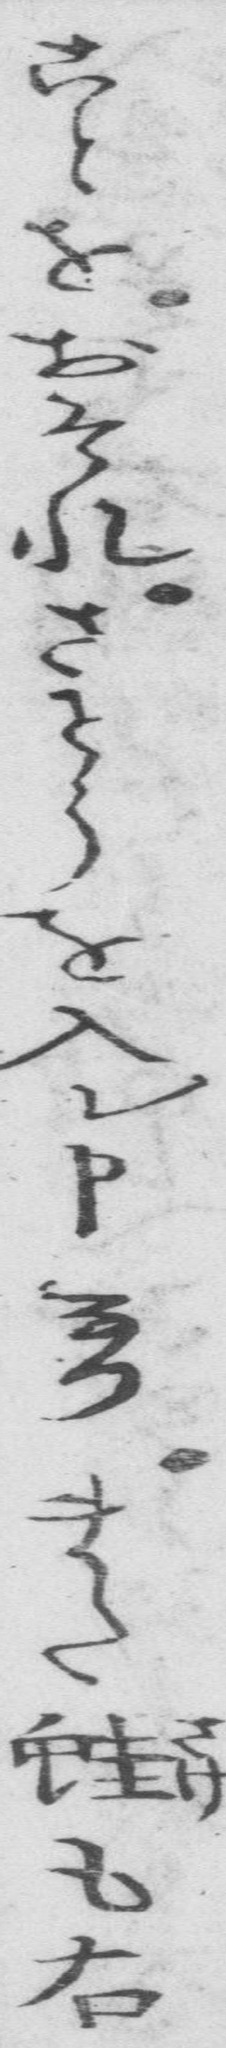ことを。おそれ。さとうを入れ申なり。また鮭も右
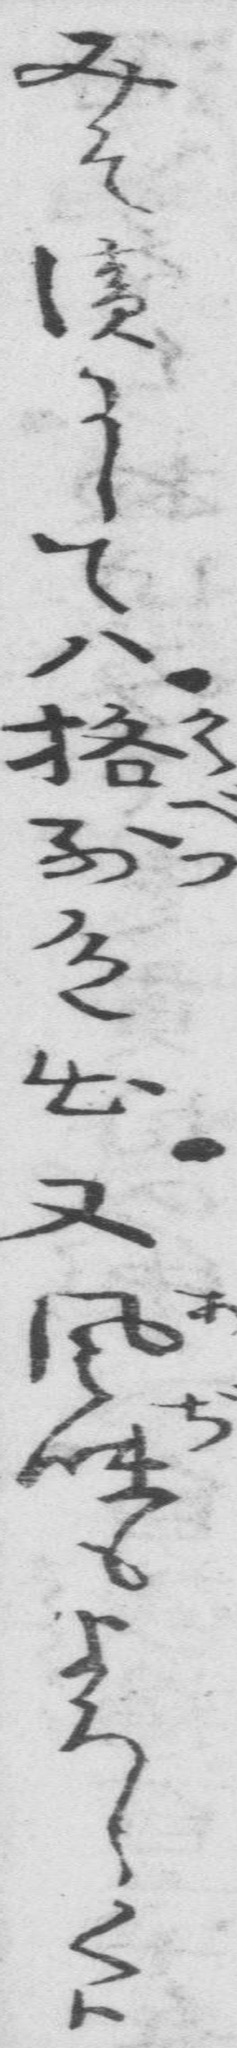みそ漬にしては。格別色出。又風味もよろしく候
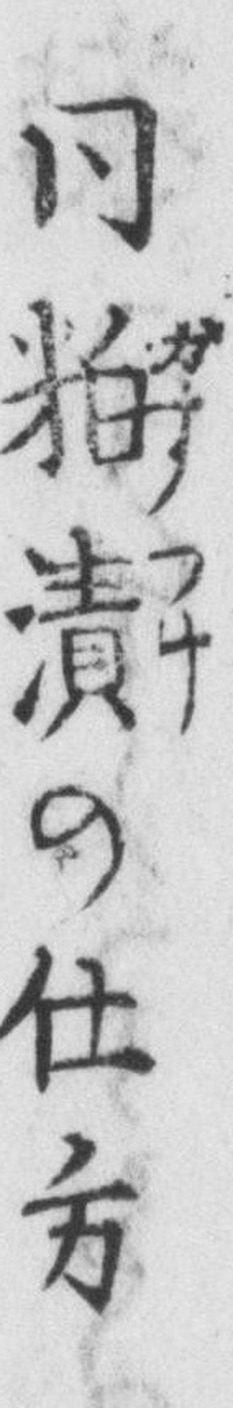同粕漬の仕方
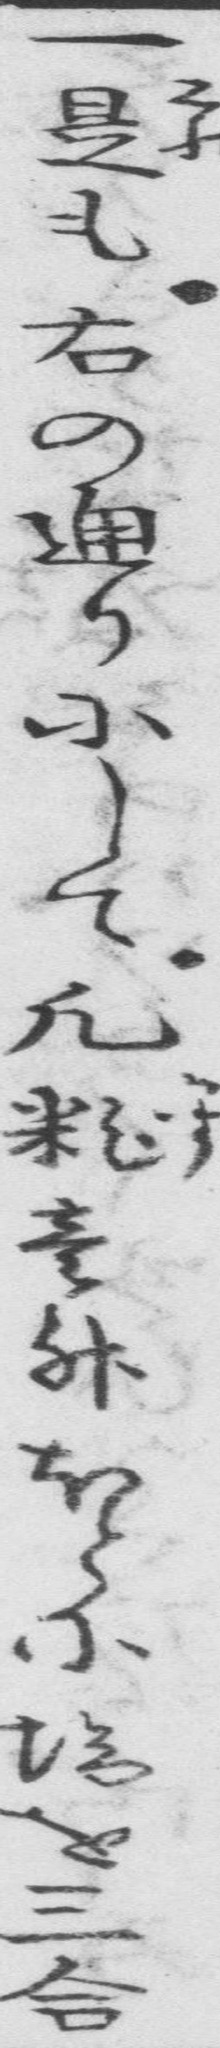一是も。右の通りにして。凡粕壱升ほとに塩を三合
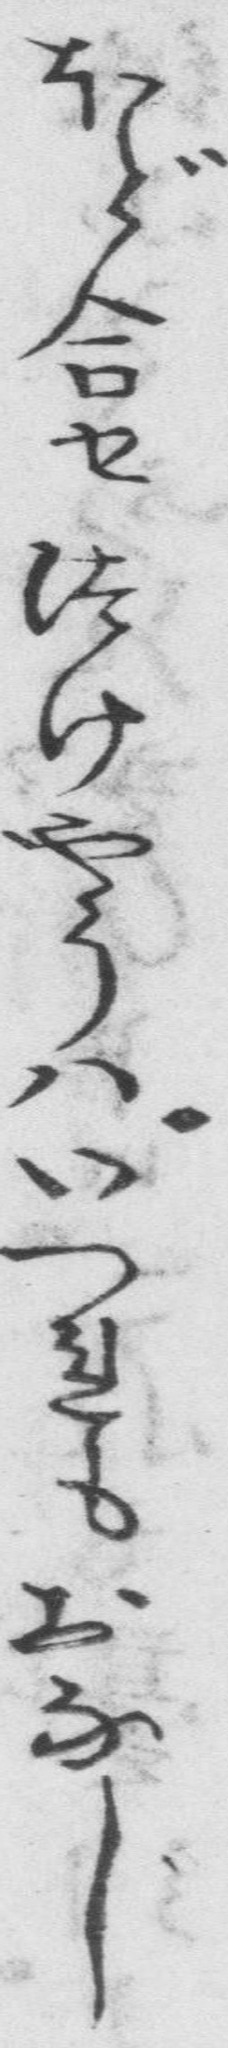ほど合せつけやうは。いつれもおなし
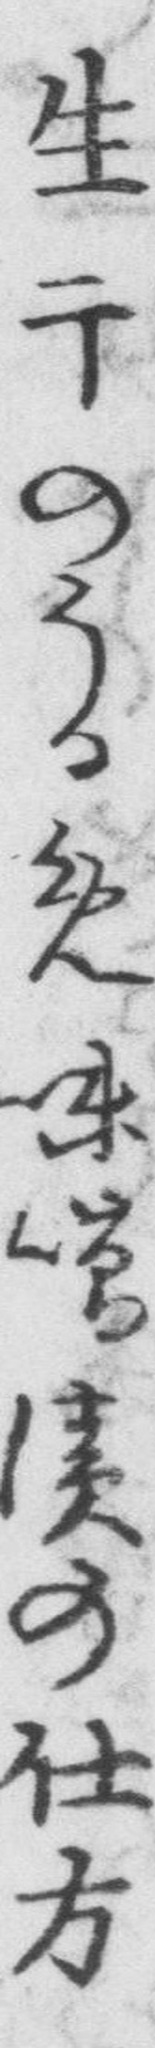生干のうるめ。味噌漬の仕方
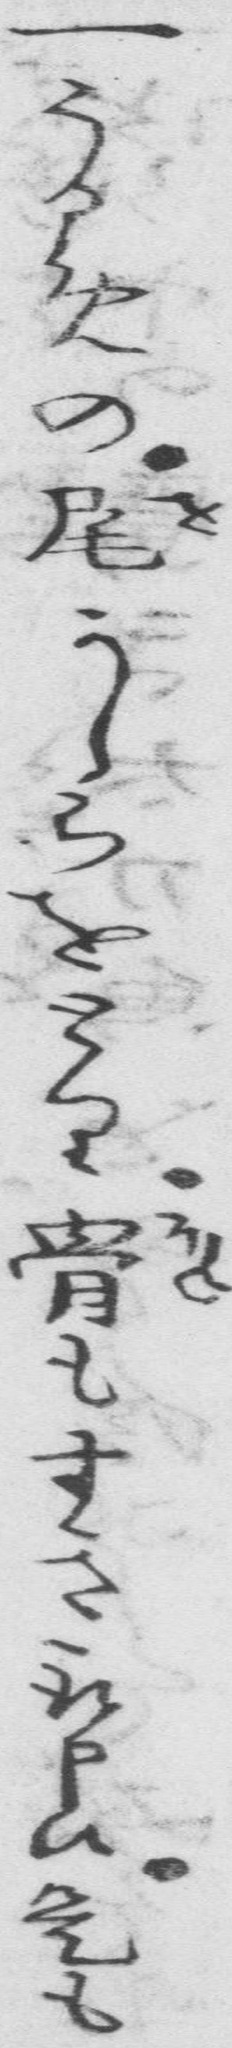壱うるめの。尾かしらをとり。骨もすき取申候。是も
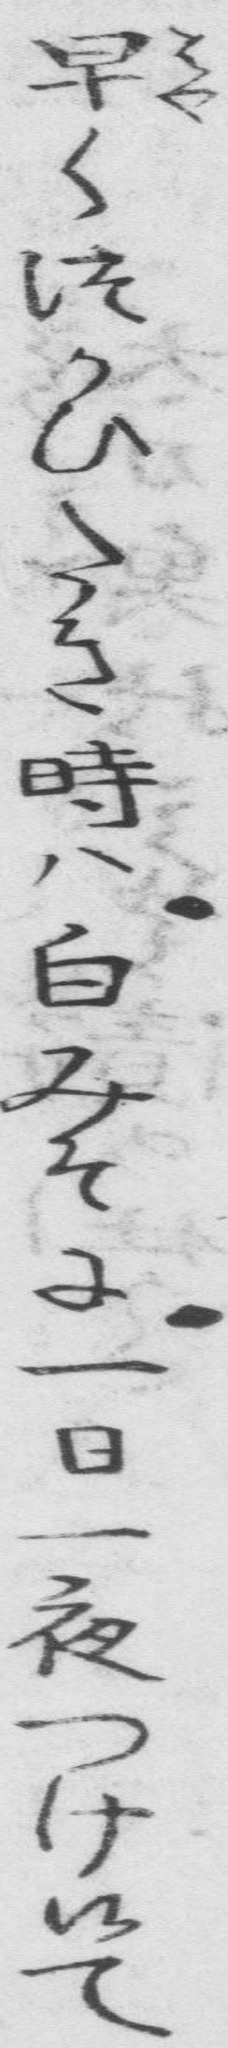早くつかひたき時は。白みそに。一日一夜。つけ候て
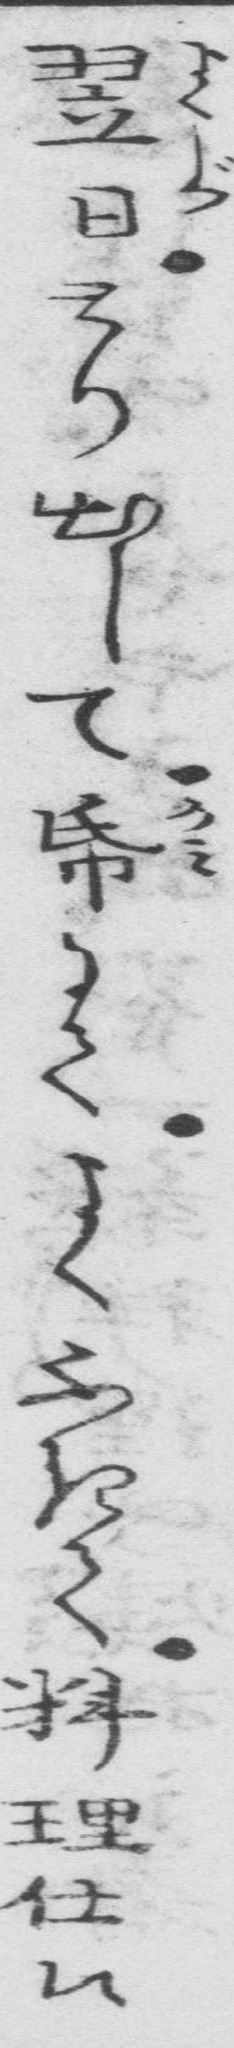翌日。とり出して。紙にて。よくふきて。料理仕候
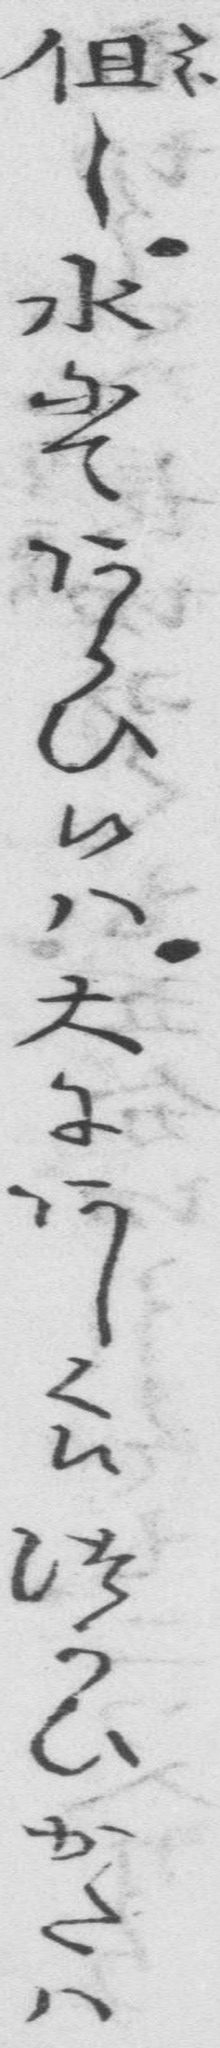但し。水にてあらひ候は。大にあしく候つかひかたは
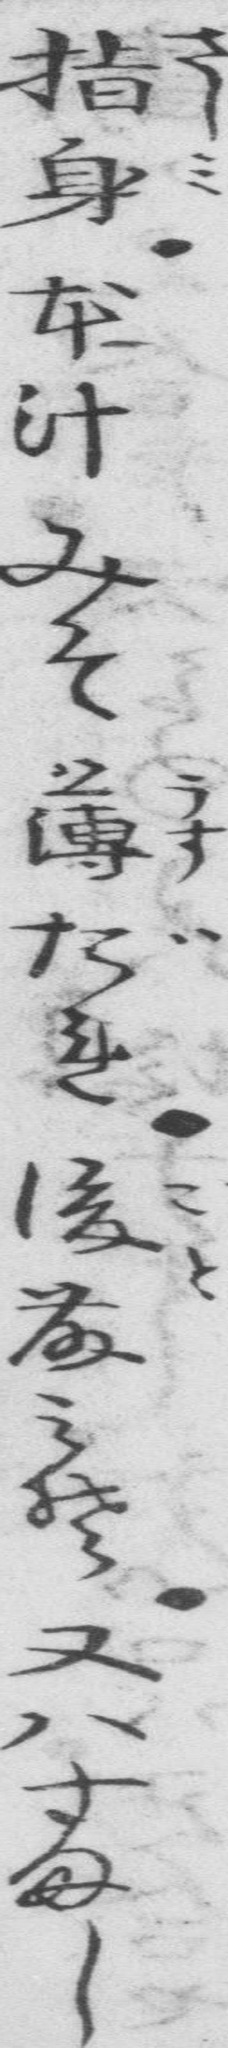指身。本汁みそ薄だれ。後藤みそ。又はすまし

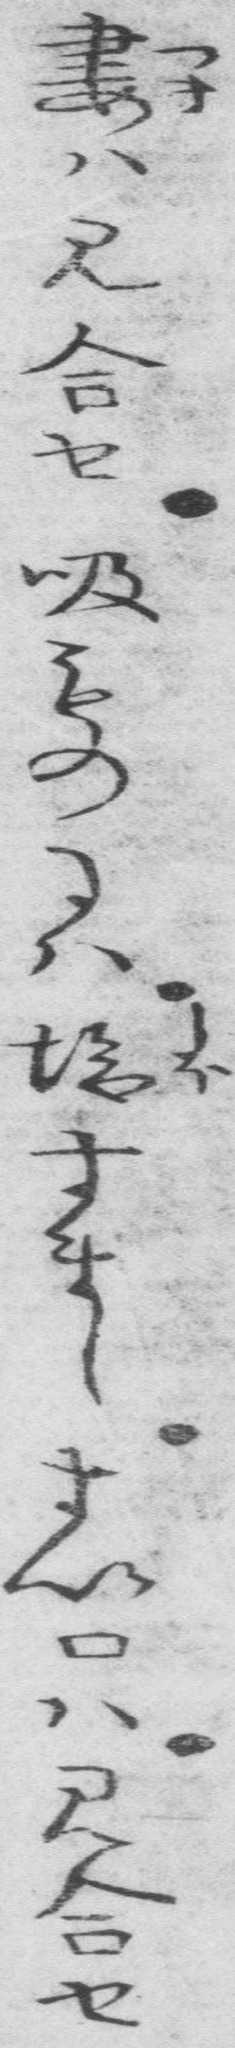妻は見合せ。吸ものには。塩すまし。すい口は。見合せ
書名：萬寳料理秘密箱
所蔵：大阪府立大学学術情報センター 国文学研究資料館
